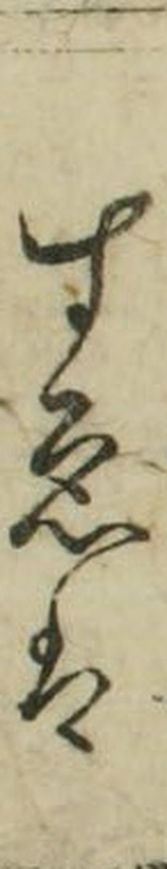すゑは
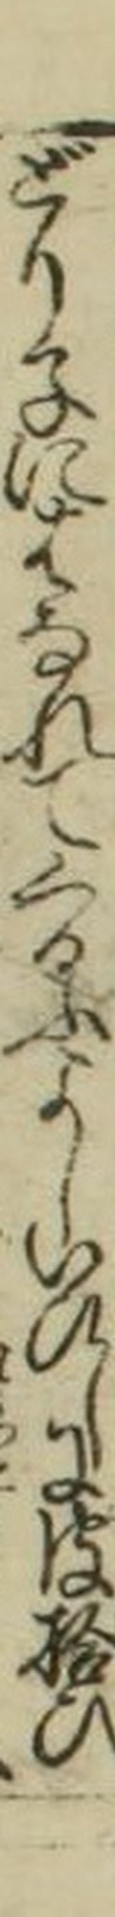どり子にはなれてくるふよしいひしに彼拾ひ
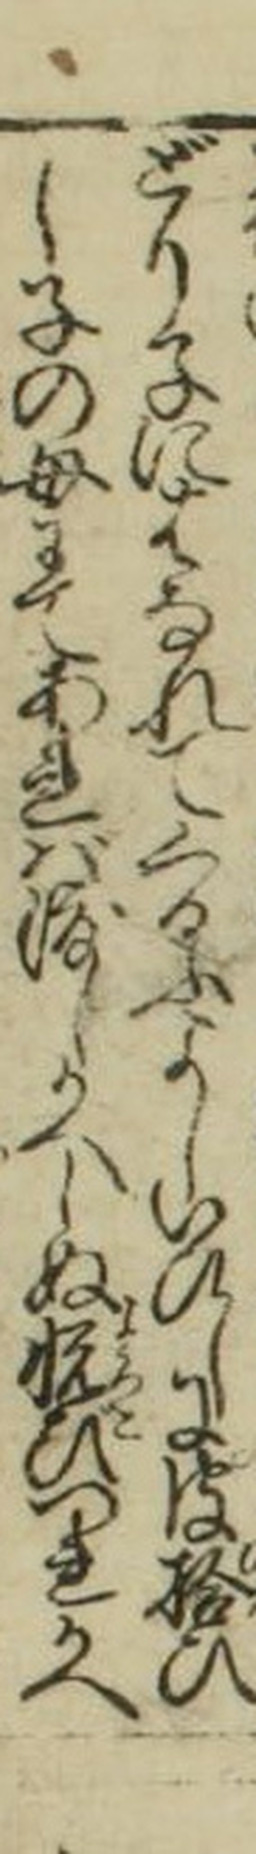し子の母にてあれば渡しかへしぬ悦びつれかへ
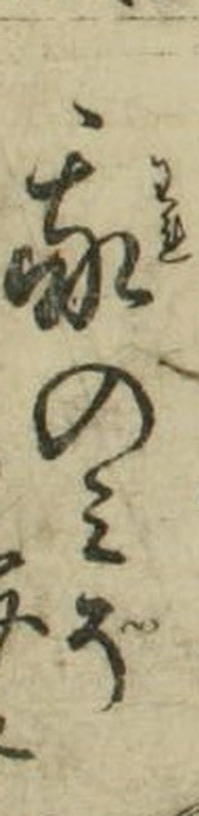我のみぞ
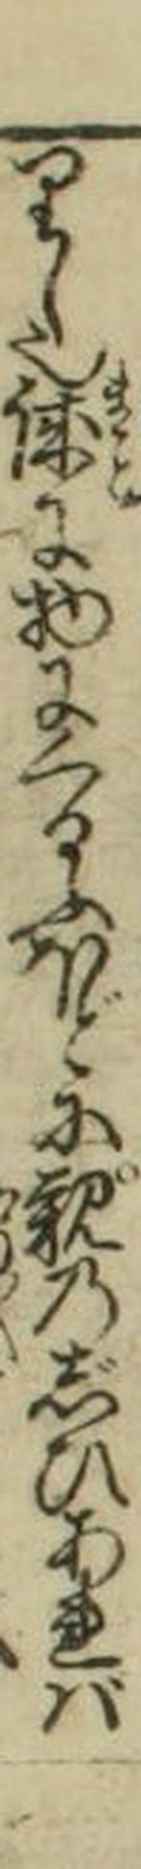りし也誠に物にくるふほどに。親のじひあれば
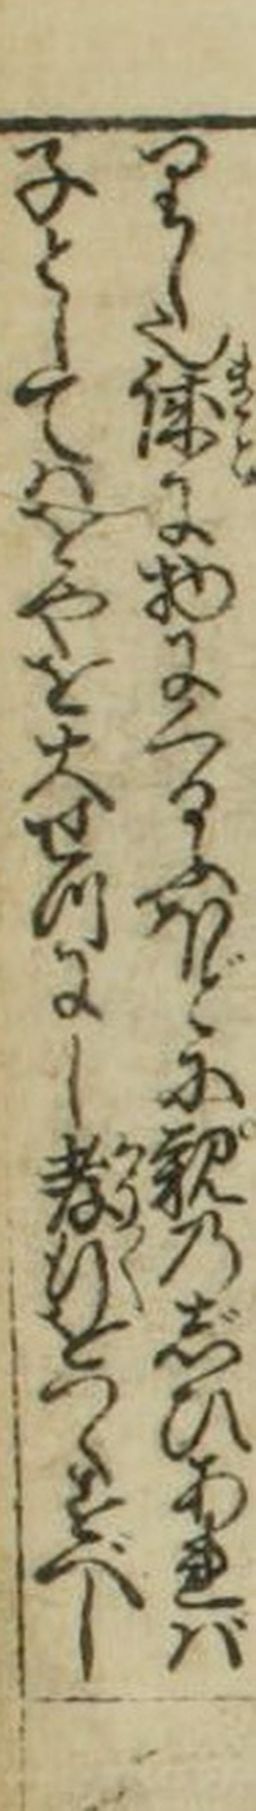子としてはをやを大せつにし孝行をつくすべし

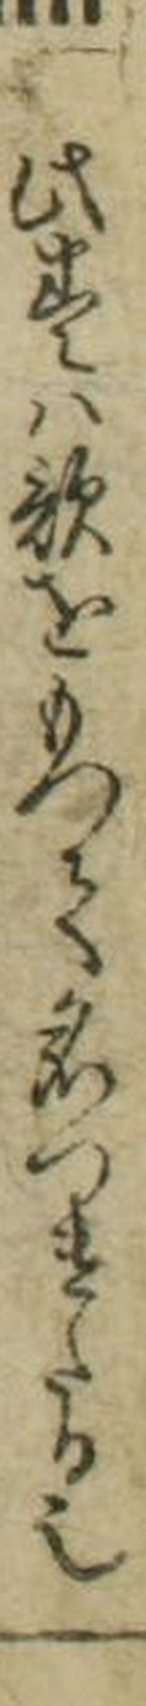此巻は歌をもつて名つけたる也
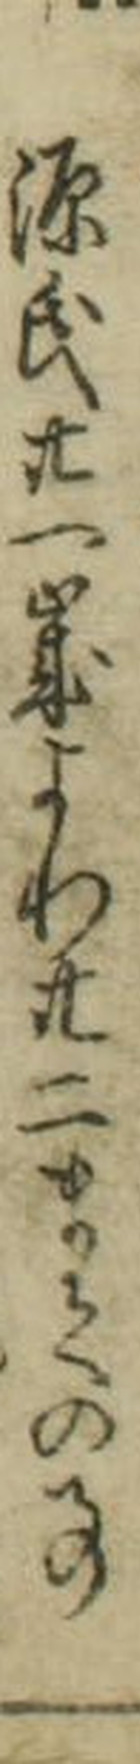源氏廿一歳より廿二まての事
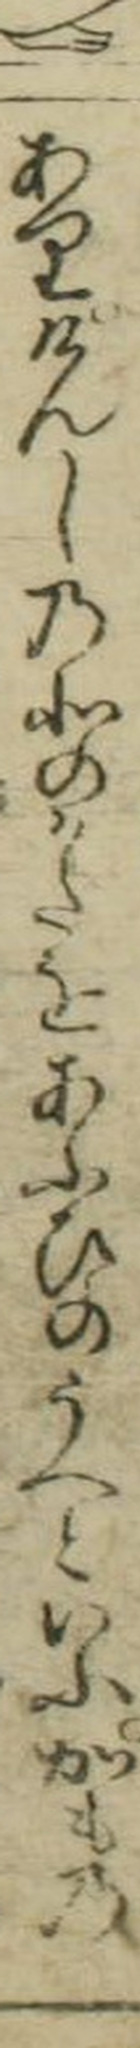あり。けんしの北のかたをあふひのうへといふ。かもの
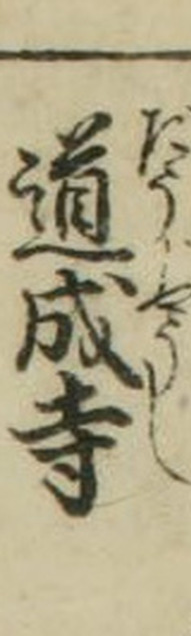道成寺
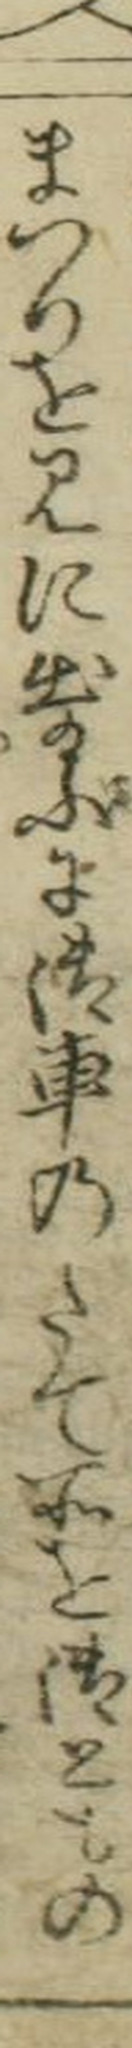まつりを見に出給ふに御車のたて所を御ともの
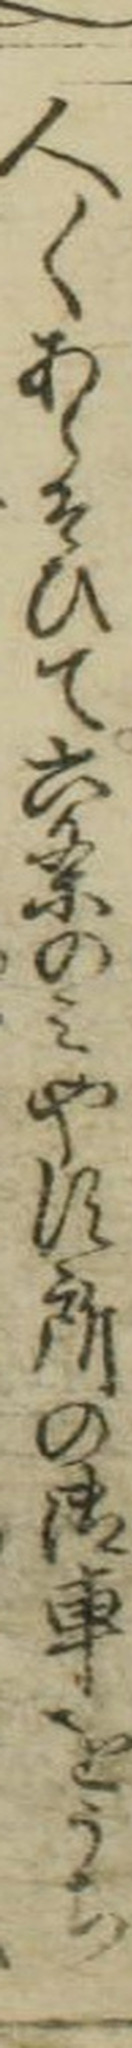人〳〵あらそひて。六条のみやす所の御車をうち
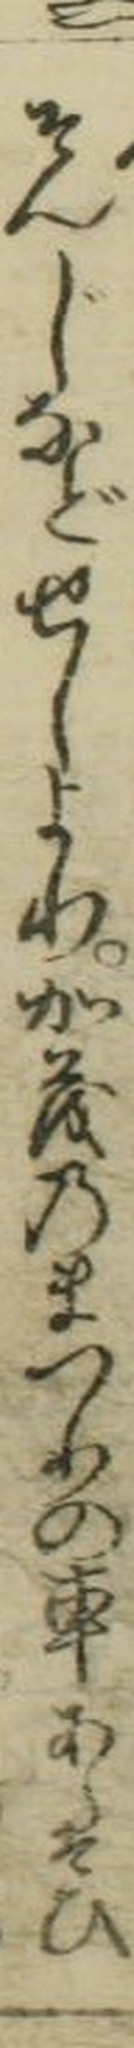そんじなどせしより。加茂のまつりの車あらそひ
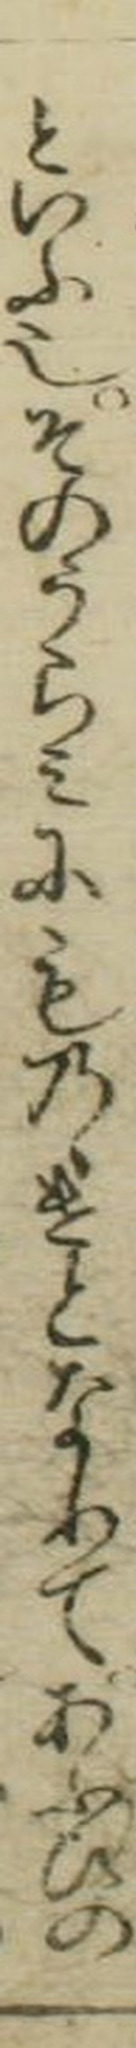といふ也。そのうらみにものゝけとなりてあふひの
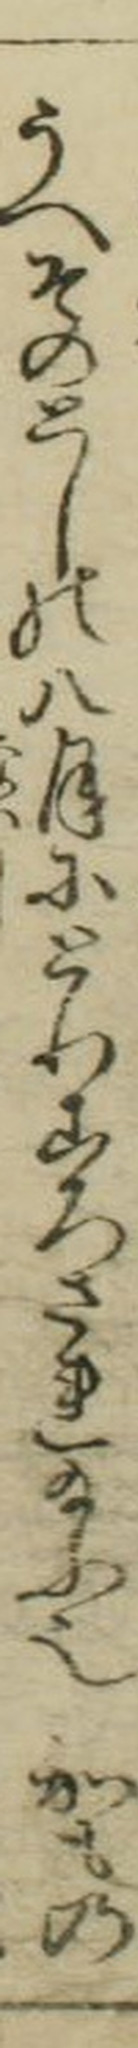うへそのとしの八月にとりころされ給ふ也○かもの
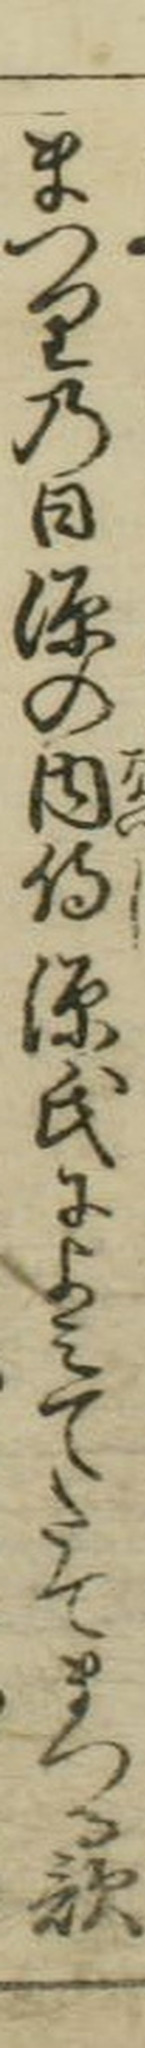まつりの日源の内侍源氏によみてたてまつる歌
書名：女源氏教訓鑑
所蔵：東京学芸大学附属図書館
